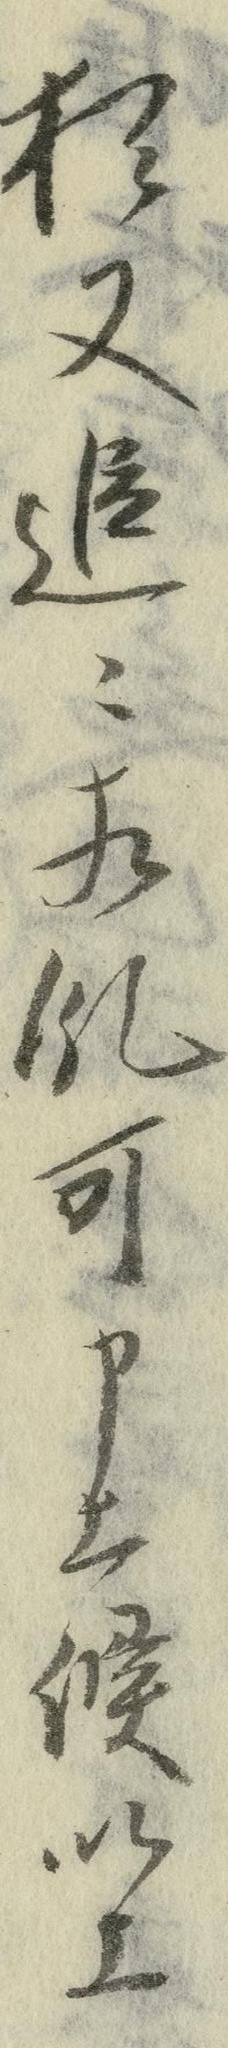猶又追々相糺可申上候以上
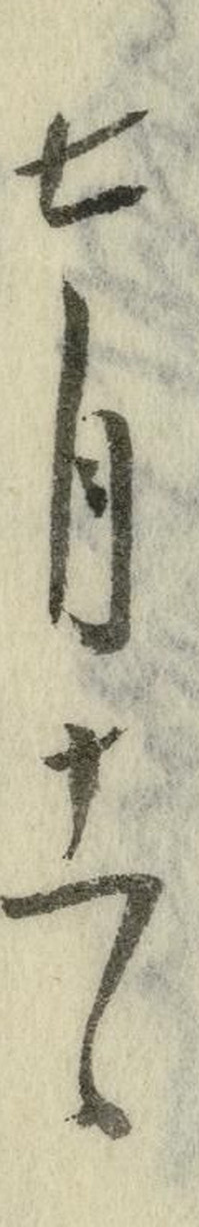七月十一日
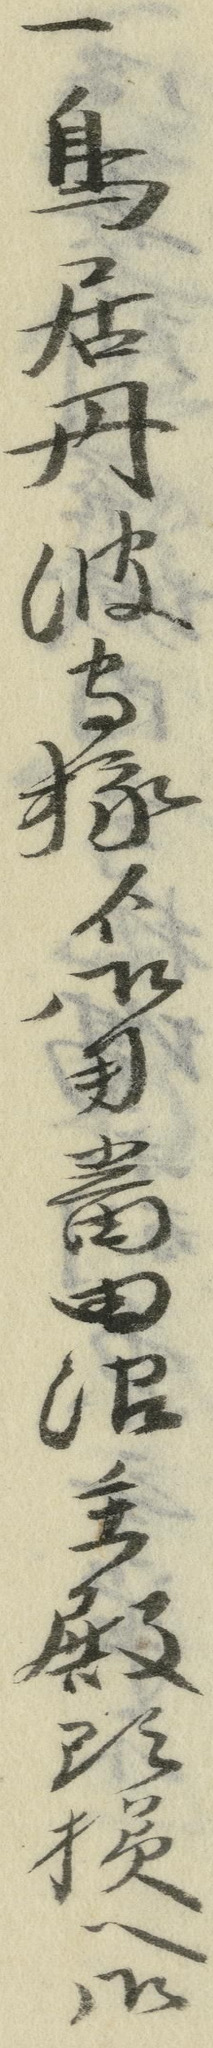一鳥居丹波守様ゟ御用番田沼主殿頭様ヘ御
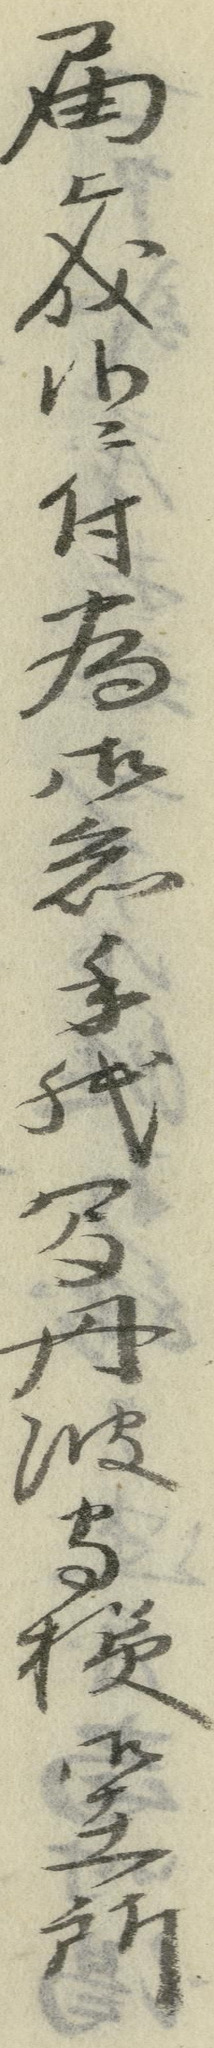届上成候ニ付為御知手紙写丹波守様御在所
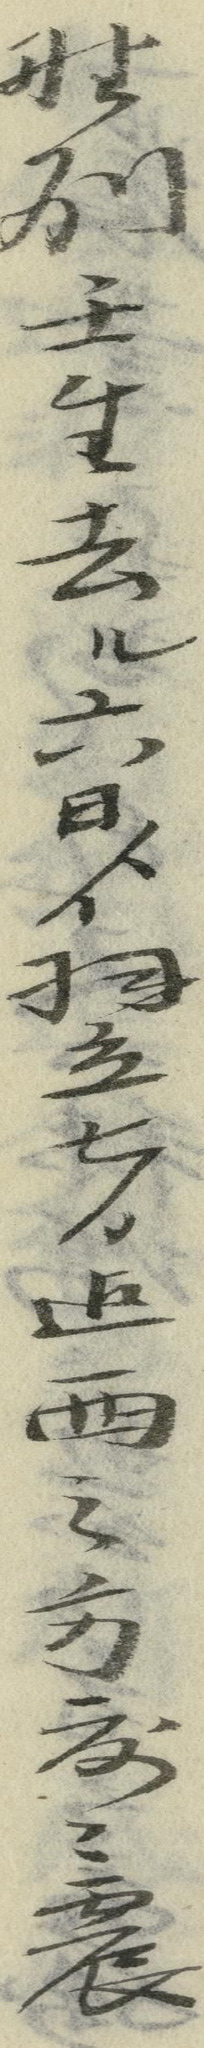野州壬生去ル]六日ゟ翌七日迄西之方度々震
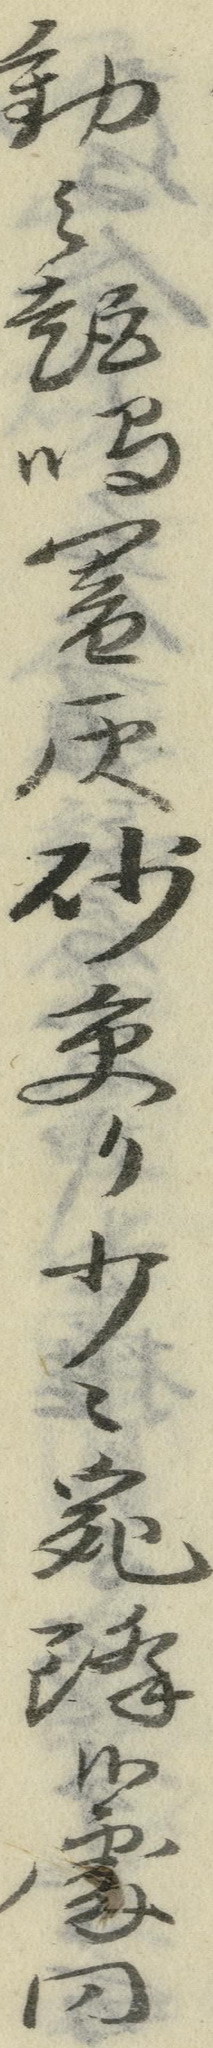動之趣鳴響灰砂交リ少々宛降候処同
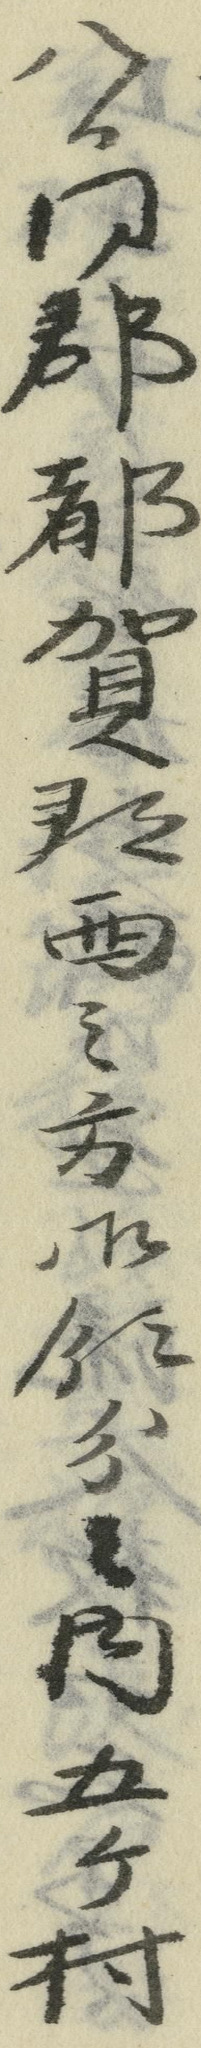八日同郡都賀郡西之方御領分之内五ケ村
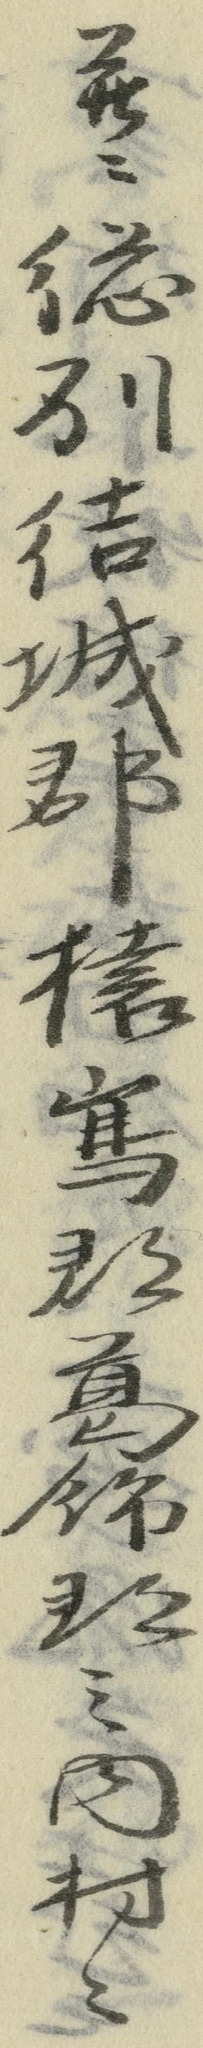并ニ総州結城郡猿島郡葛飾郡之内村々
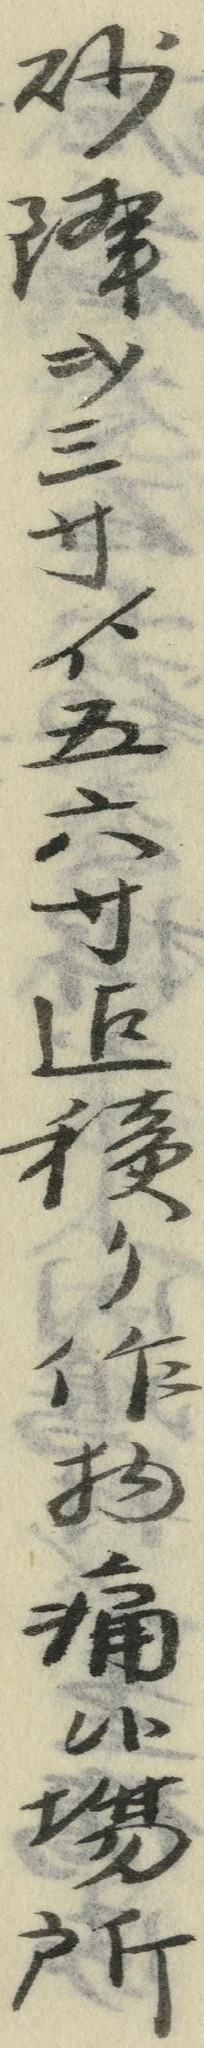砂降弐三寸ゟ五六寸迄積リ作物痛候場所
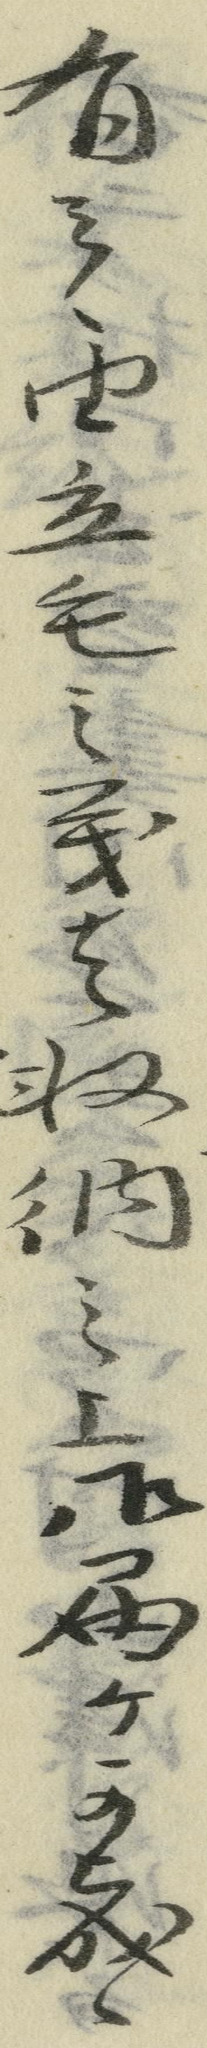有之候由立毛之義は収納之上御届ケ可被成候
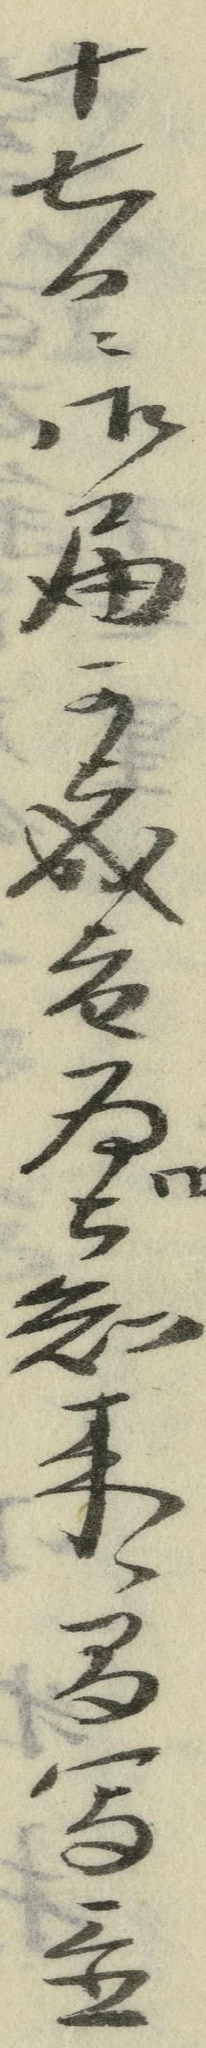十七日ニ御届可被成旨為御知来候間写置
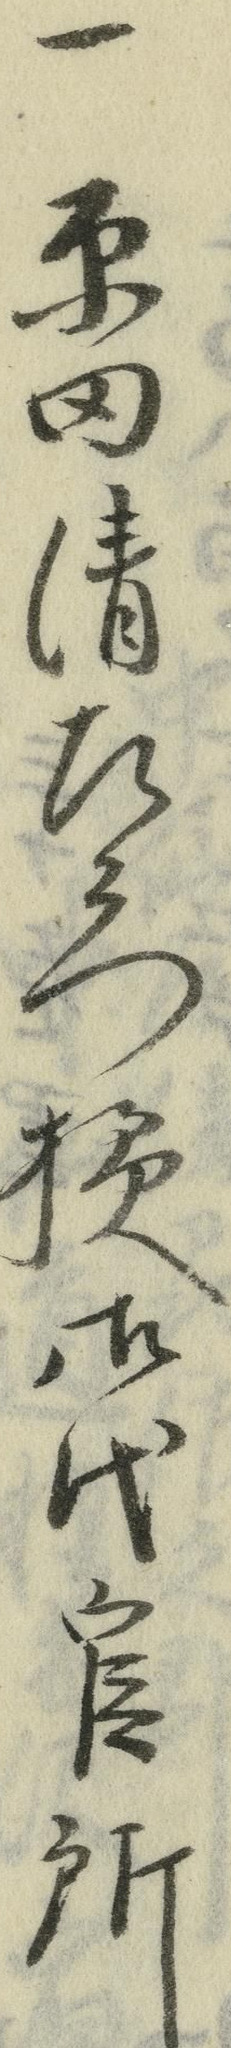一原田清左衛門様御代官所
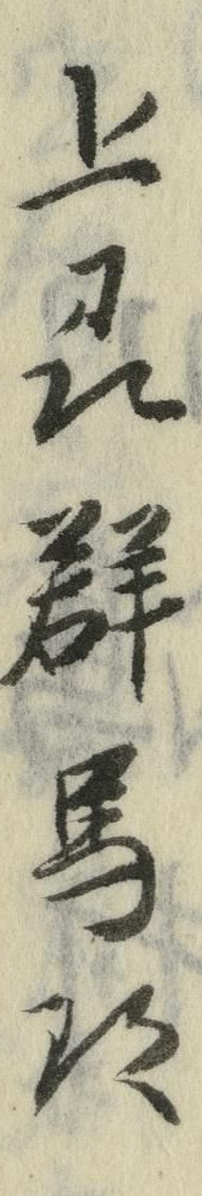上州群馬郡

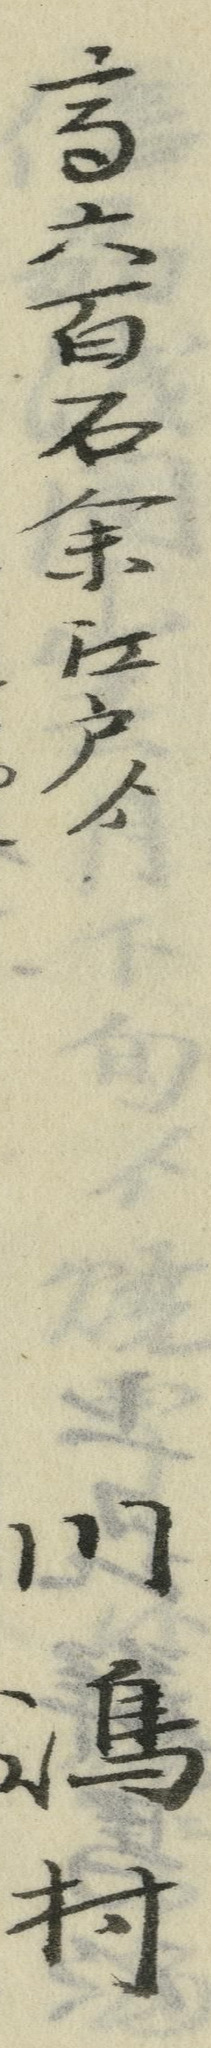高六百石余江戸ゟ川嶋村
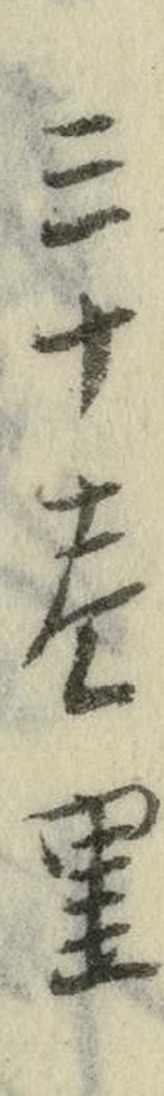三十壱里
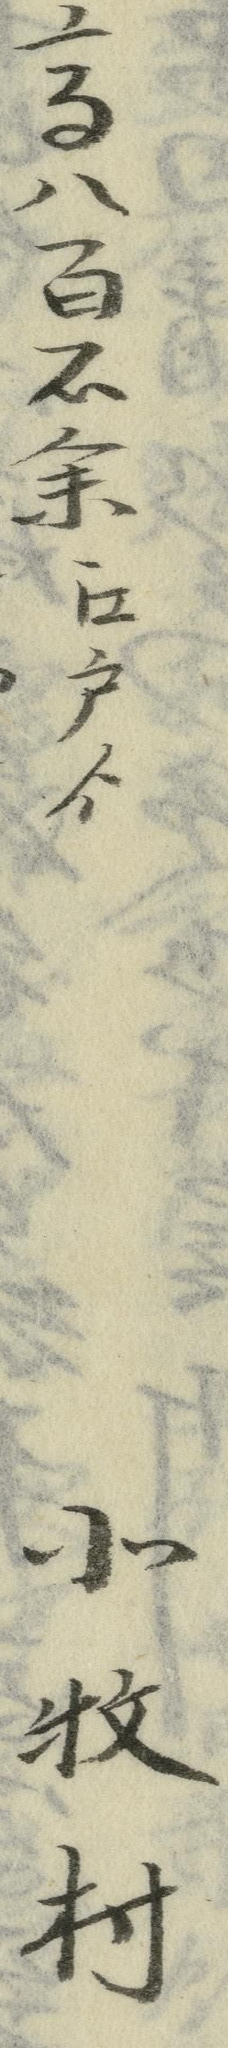高八百石余江戸ゟ北牧村
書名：天明三癸卯七月信州浅間山焼出シ上州山津浪ニ付近國ヨリ御届書并訴書写
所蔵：東京大学地震研究所図書室 Earthquake Research Institute Library, The University of Tokyo, JAPAN
